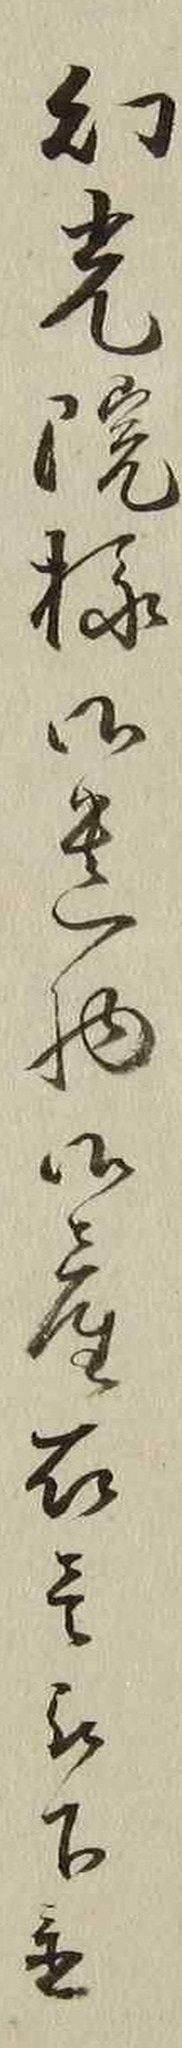幻光院様御遺物御産衣壱被下置
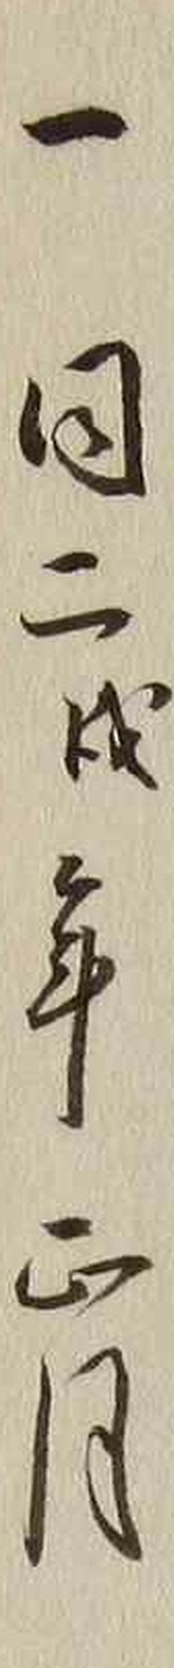一同二戌年正月
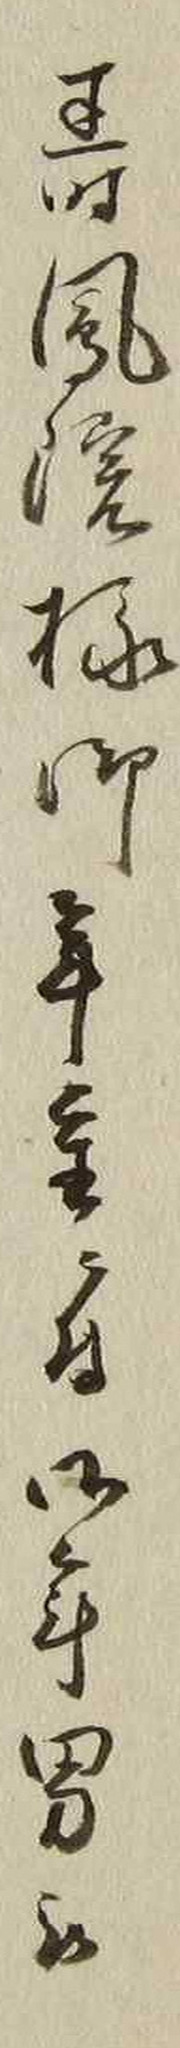寿鳳院様御年重ニ付御年男被
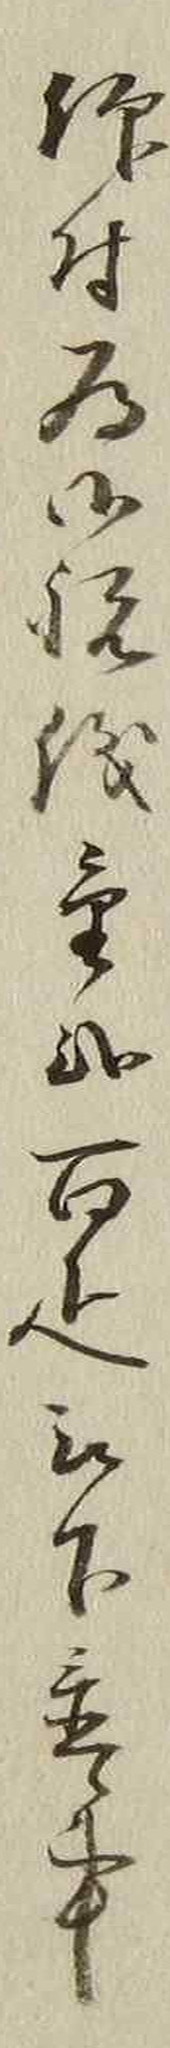仰付為御祝儀金弐百疋被下置候事
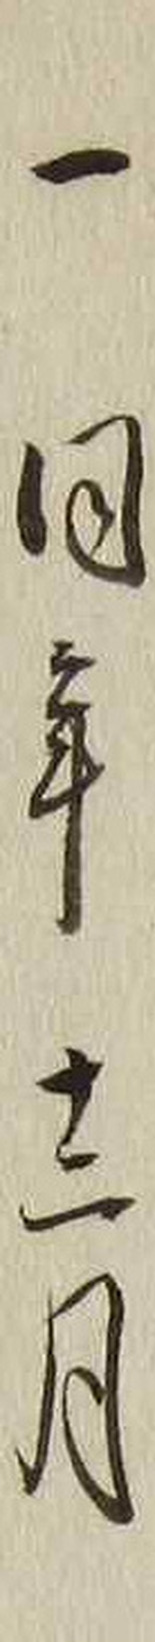一同年十二月
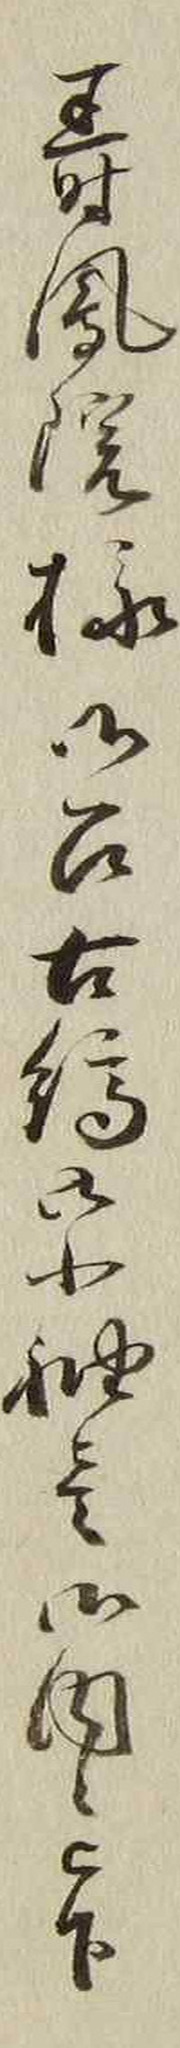寿鳳院様御召古縞御小袖壱御内々被下
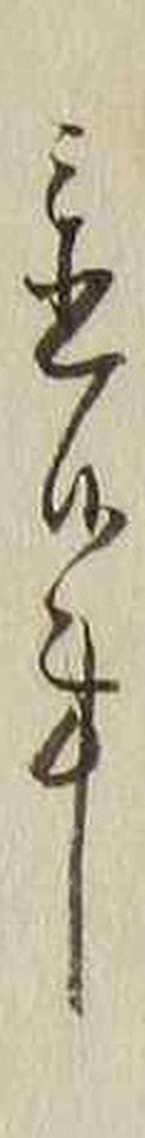置候事
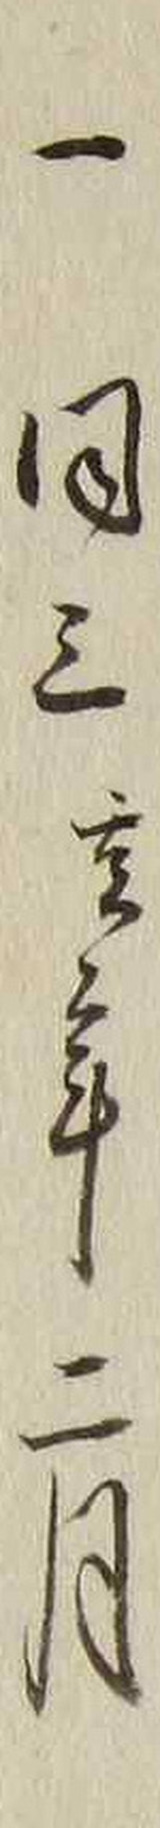一同三亥年二月
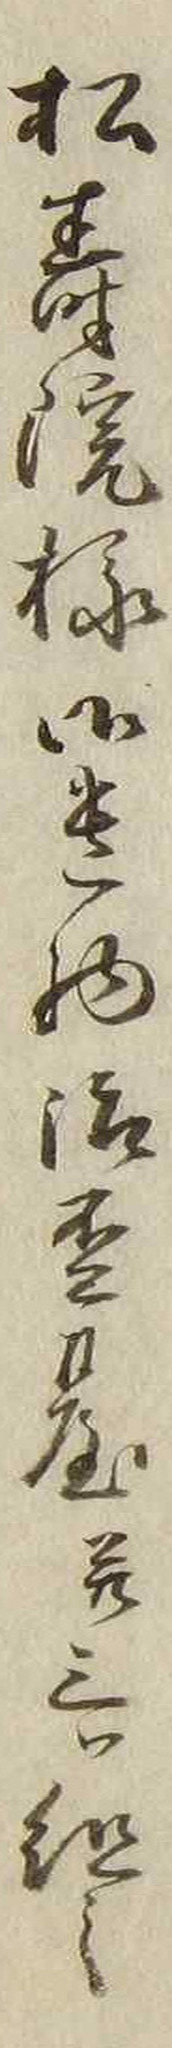松寿院様御遺物御盃台并三ツ組之

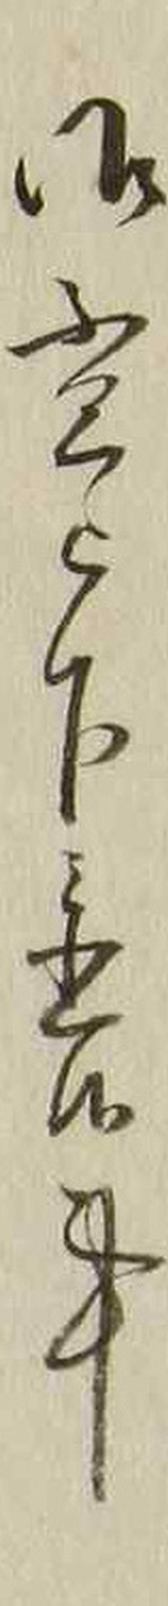御盃被下置候事
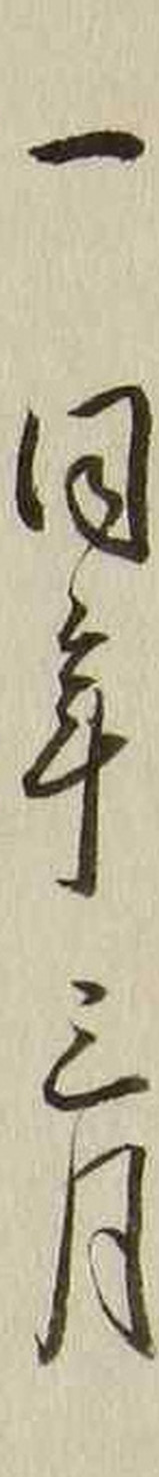一同年三月
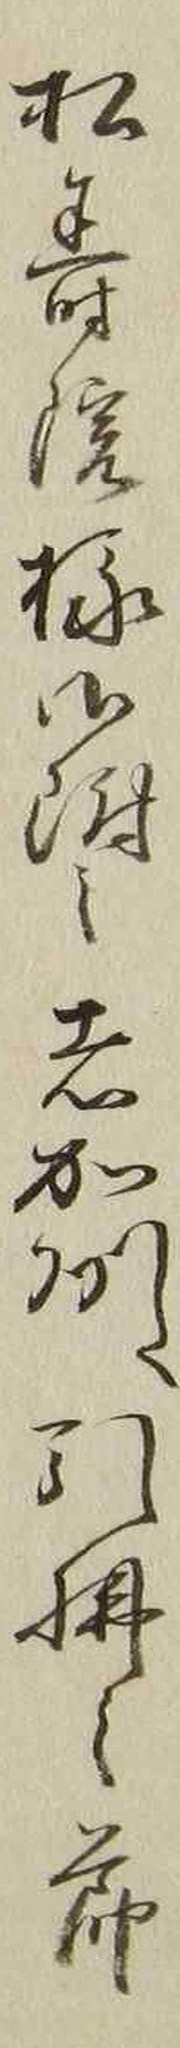松寿院様御附之者加州へ引払之節
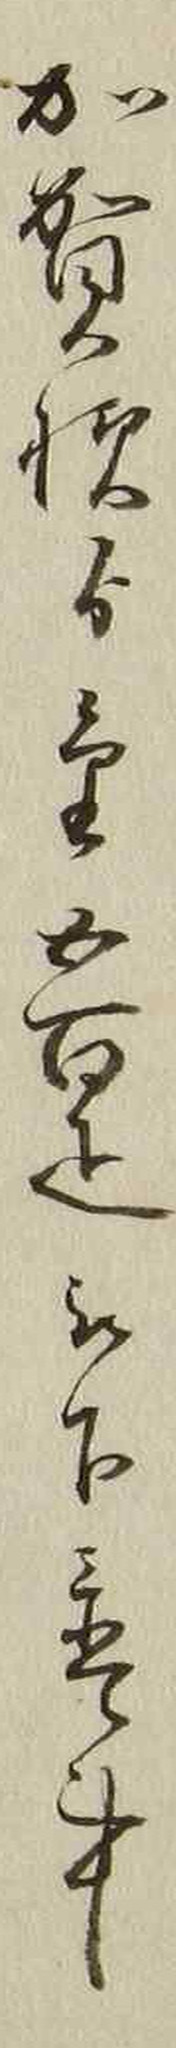加賀様ゟ金五百疋被下置候事
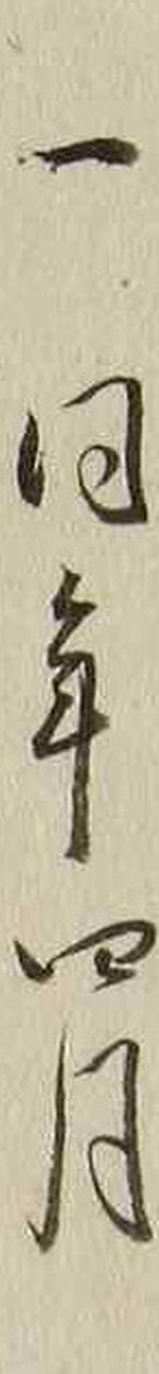一同年四月
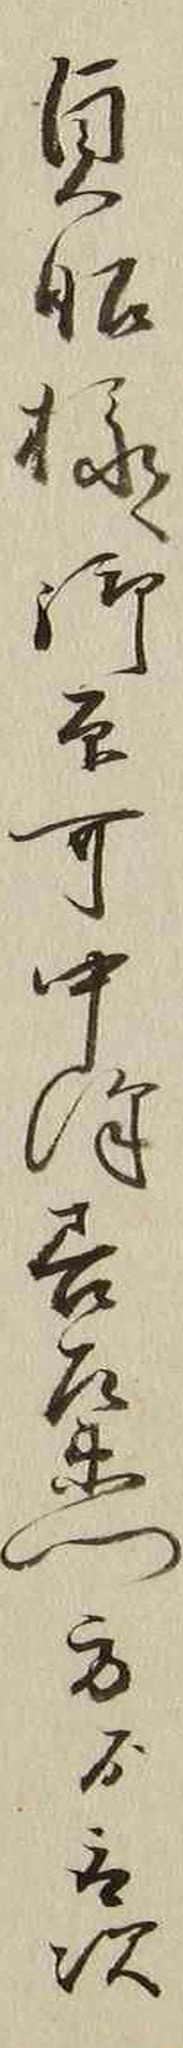貞昭様へ御印可中沢善左衛門方ゟ取次
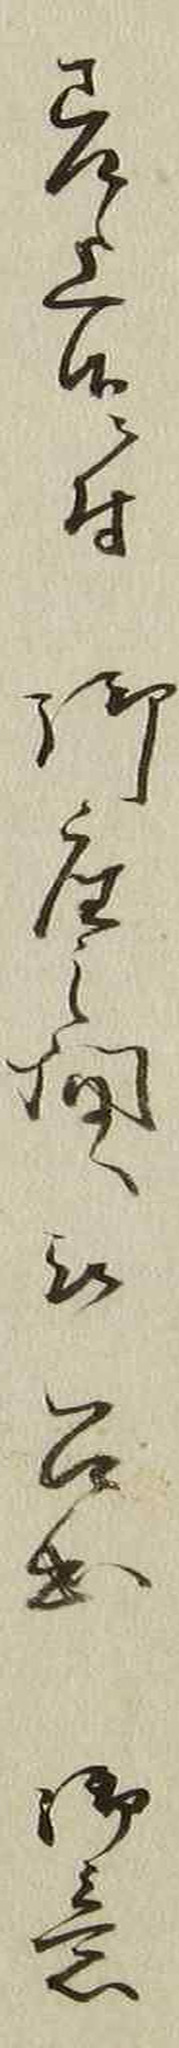差上候ニ付御座之間へ被召出御意
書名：諸士系譜　巻之28　い之部28
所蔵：会津若松市立会津図書館
